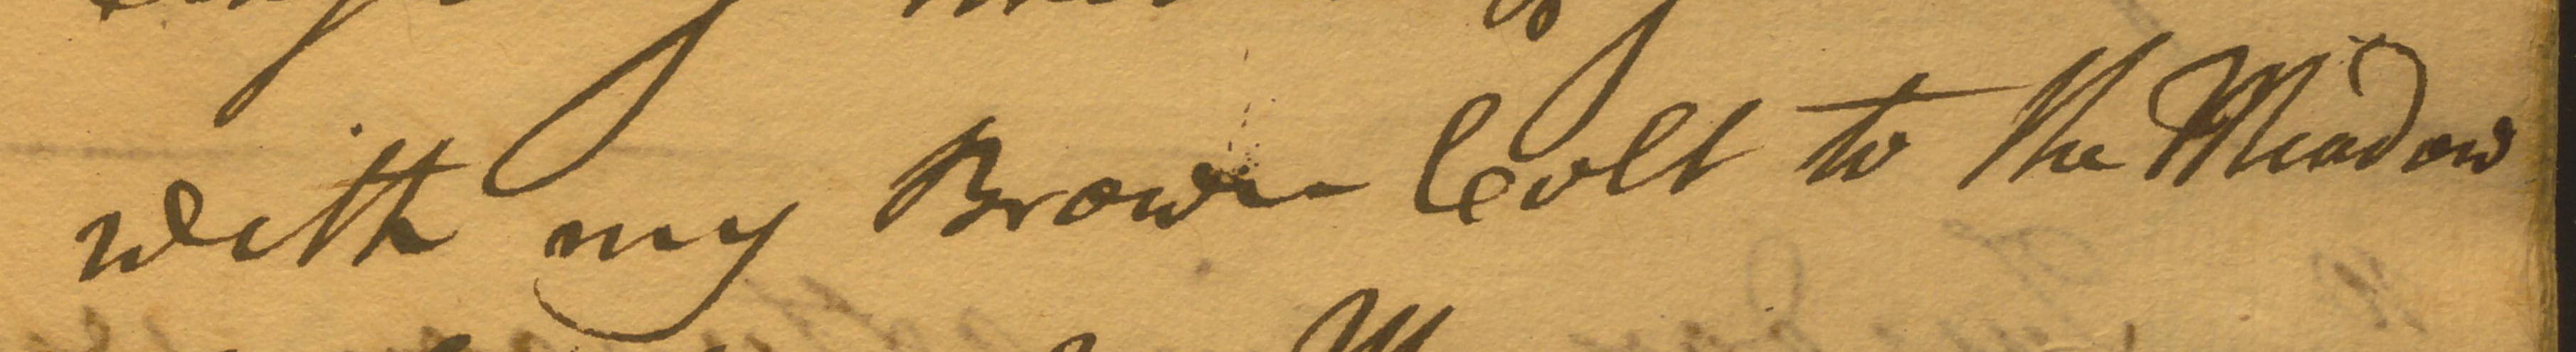with my Brown Colt to the Meadow
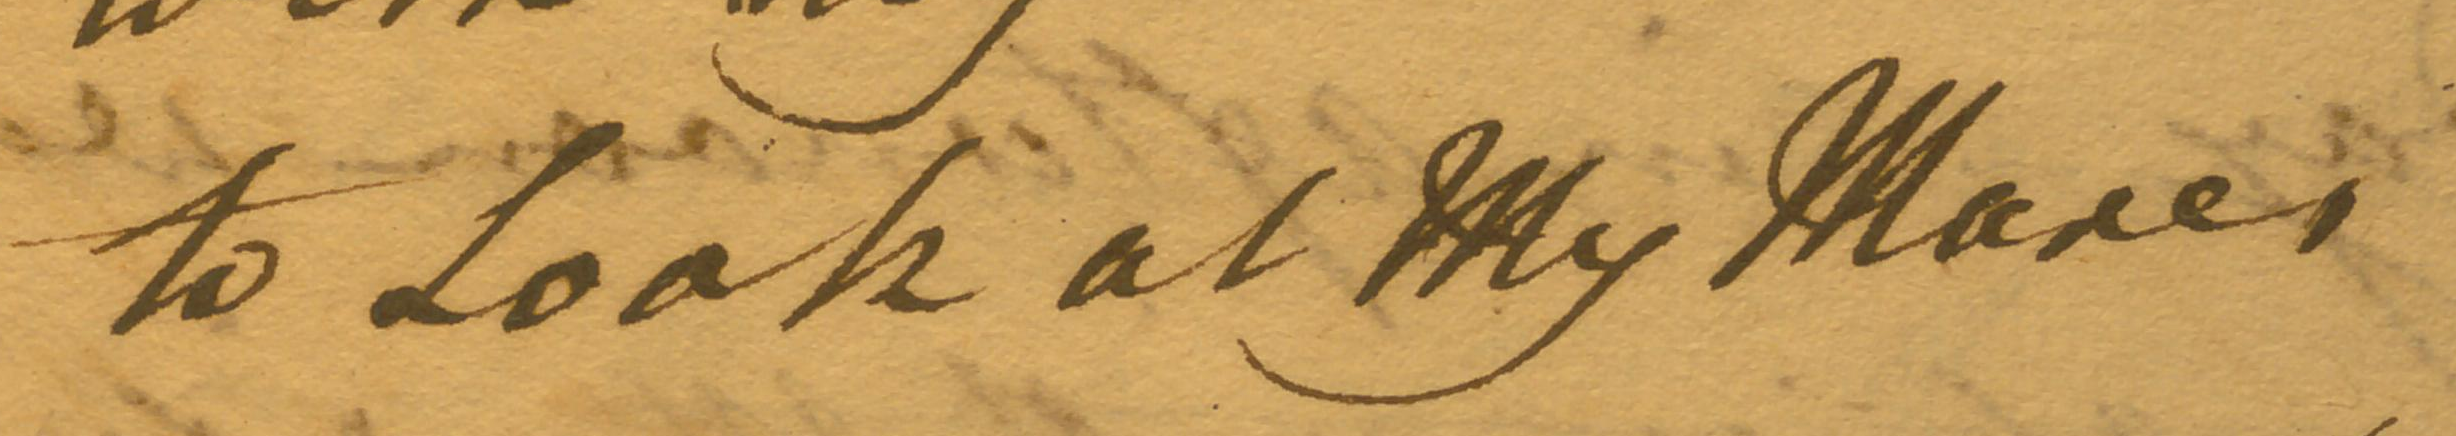to Look at My Mares
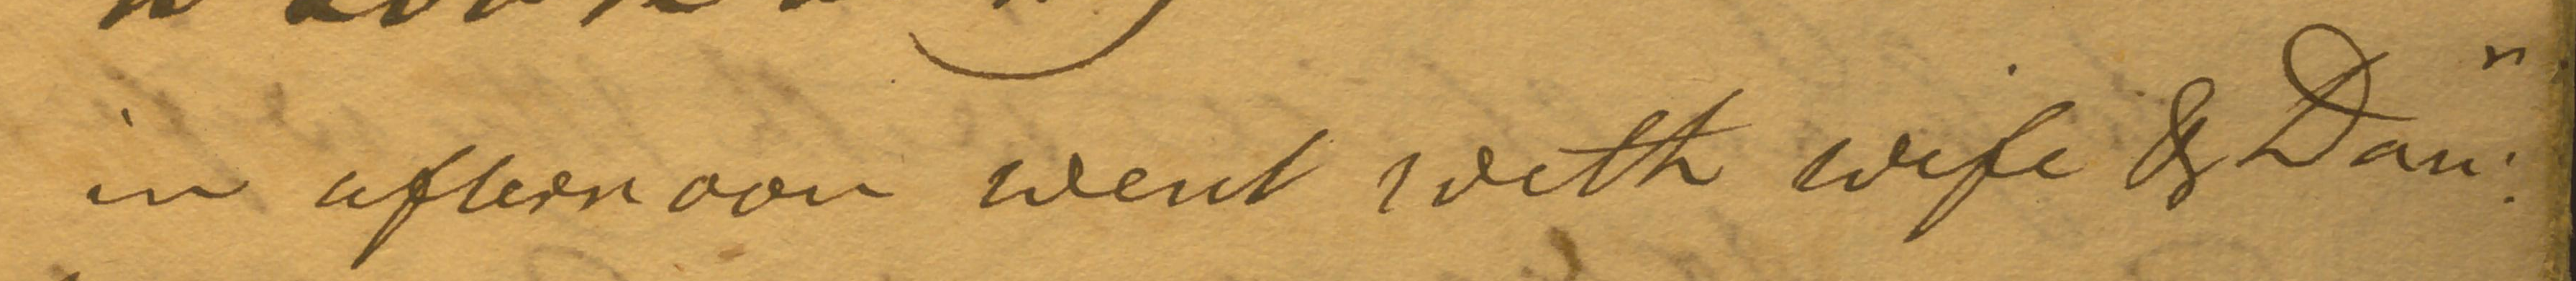in afternoon went with wife & Dau^r.
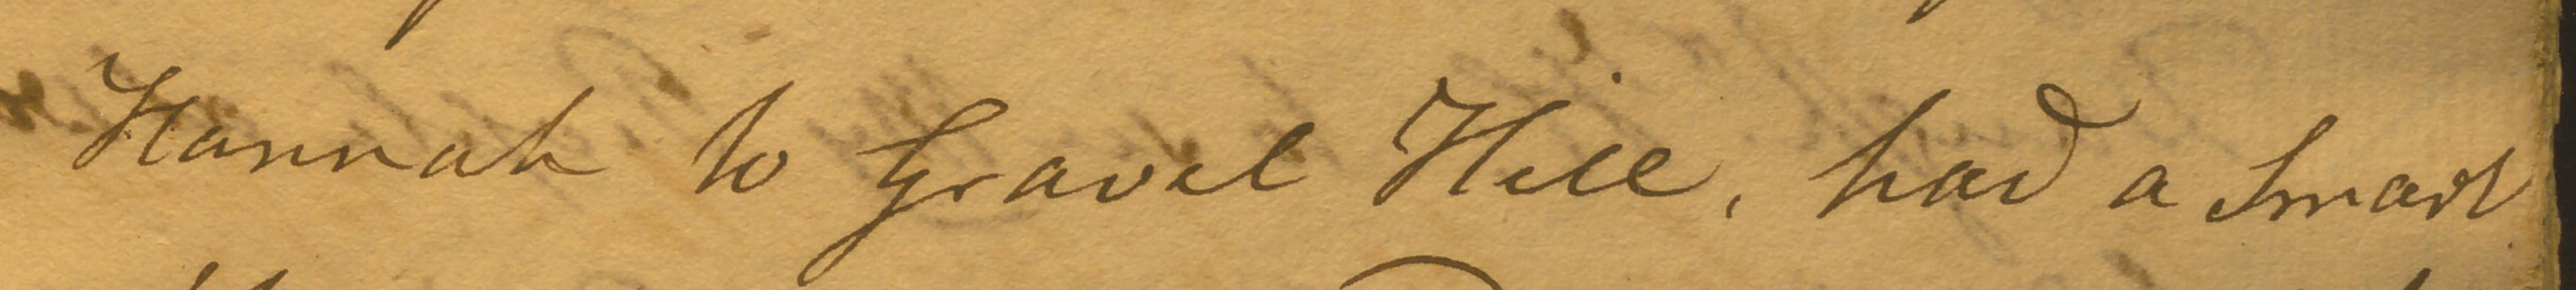Hannah to Gravel Hill, had a smart
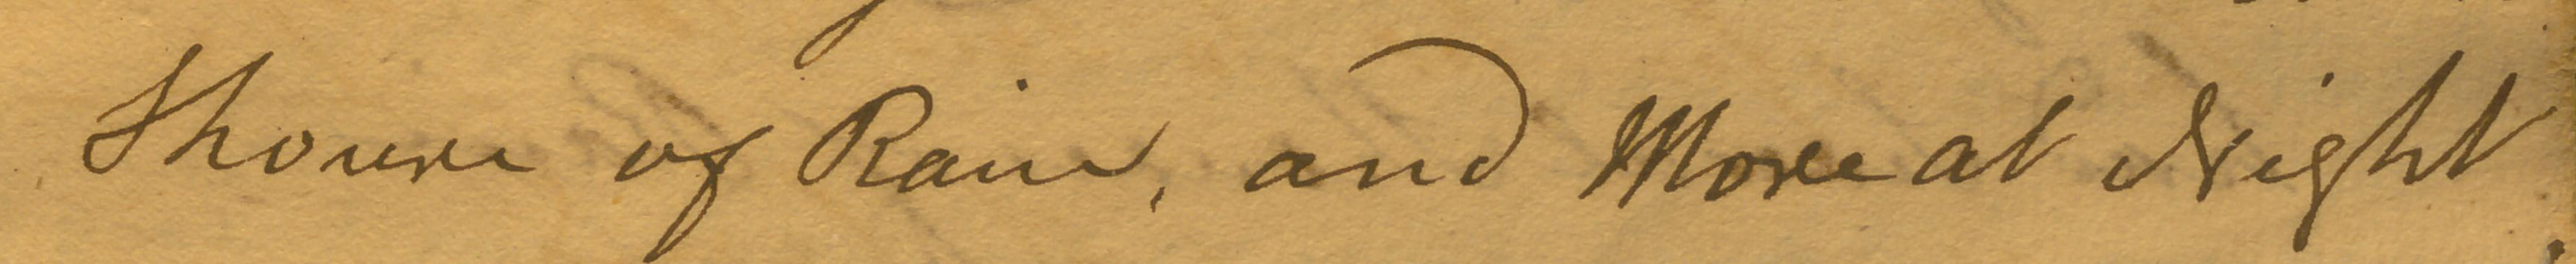shoure of Rain, and More at Night
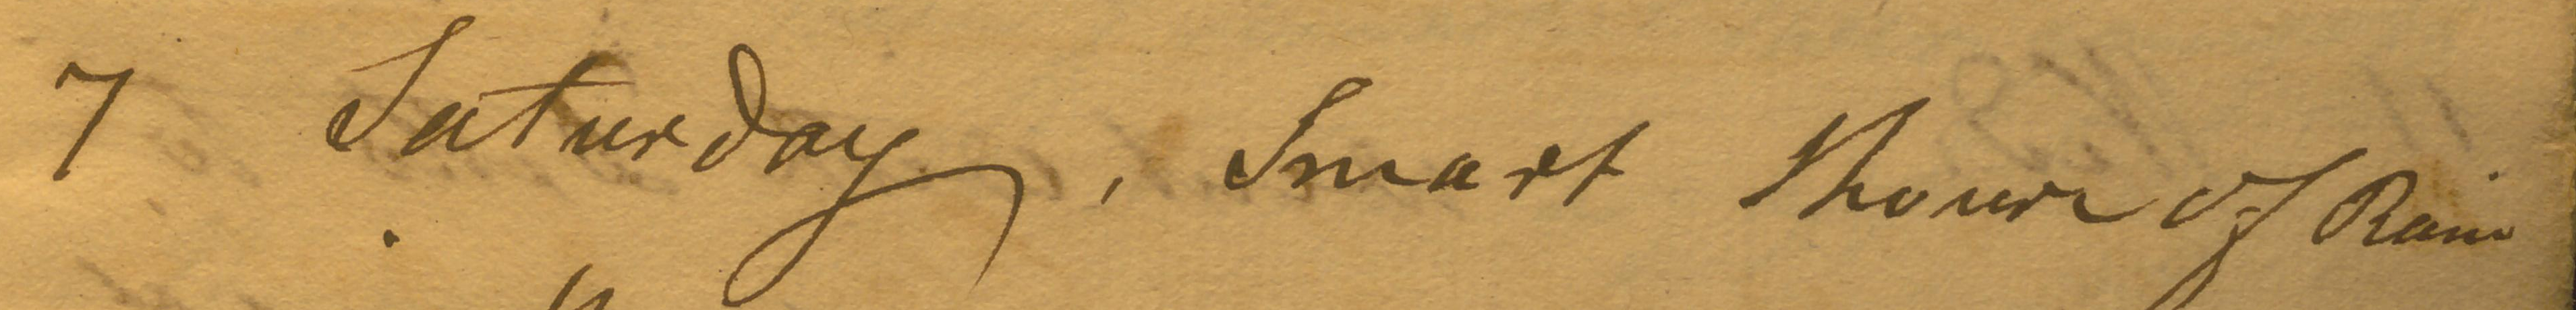7 Saturday, smart shoure of Rain
